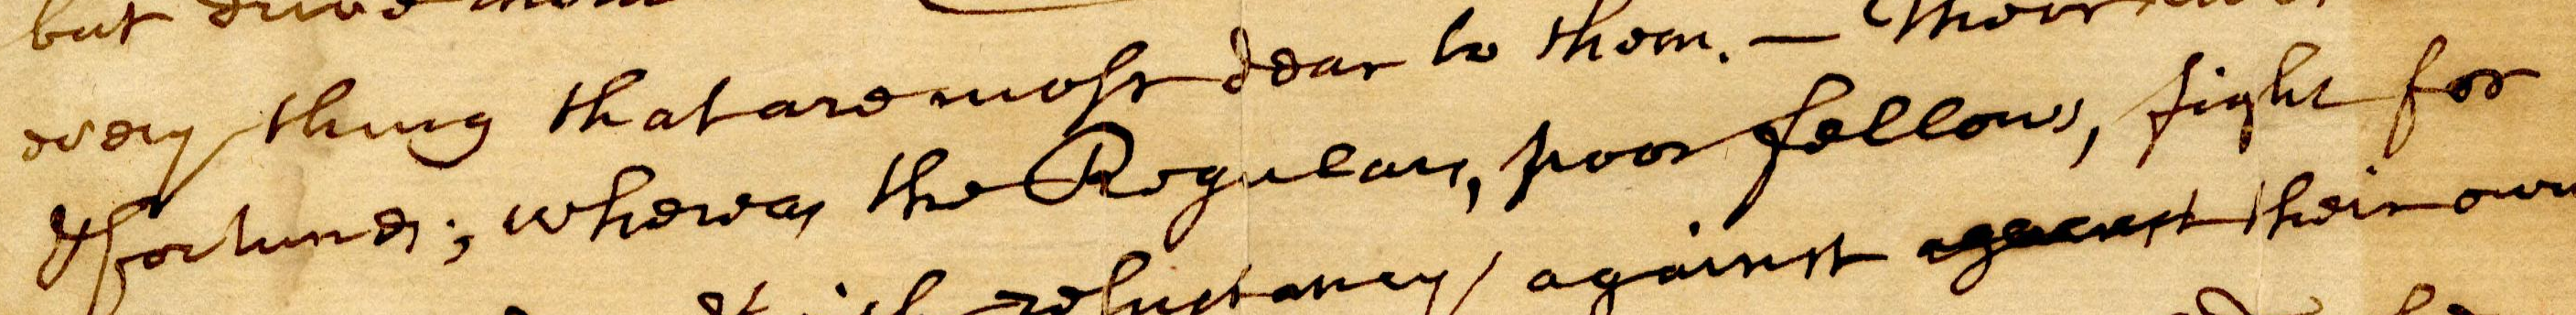& fortune; whereas the Regular, poor fellows, fight for
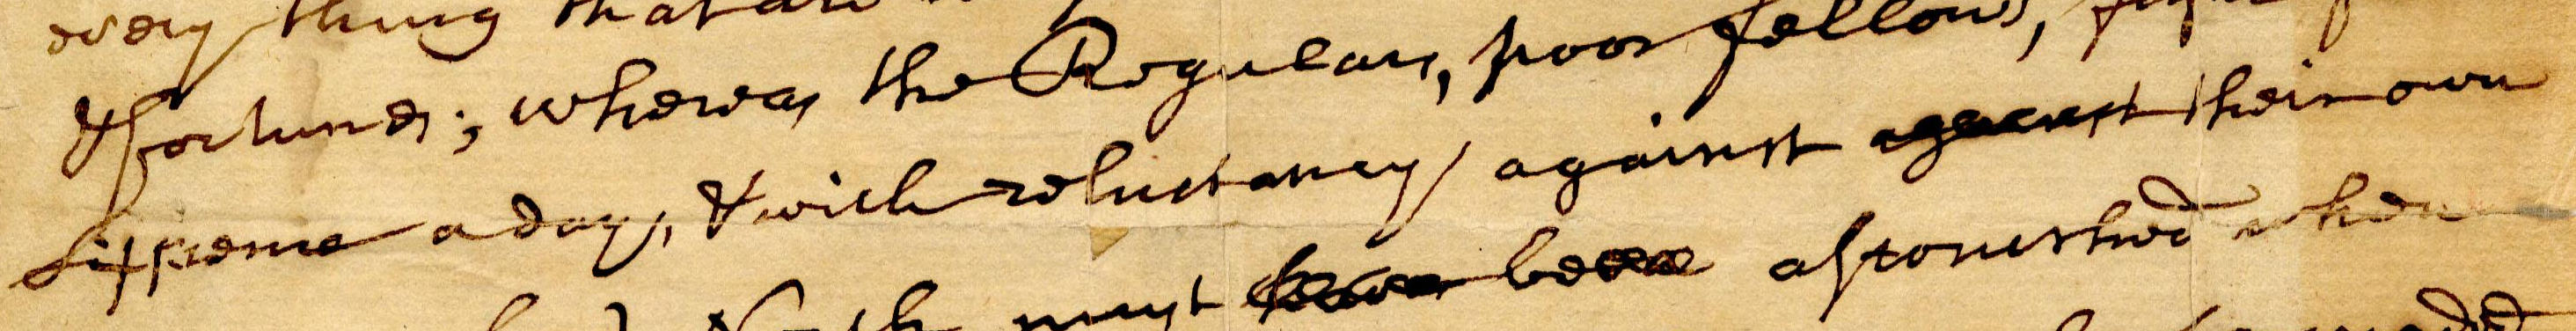Sixpence a day, & with which any against [against] their own
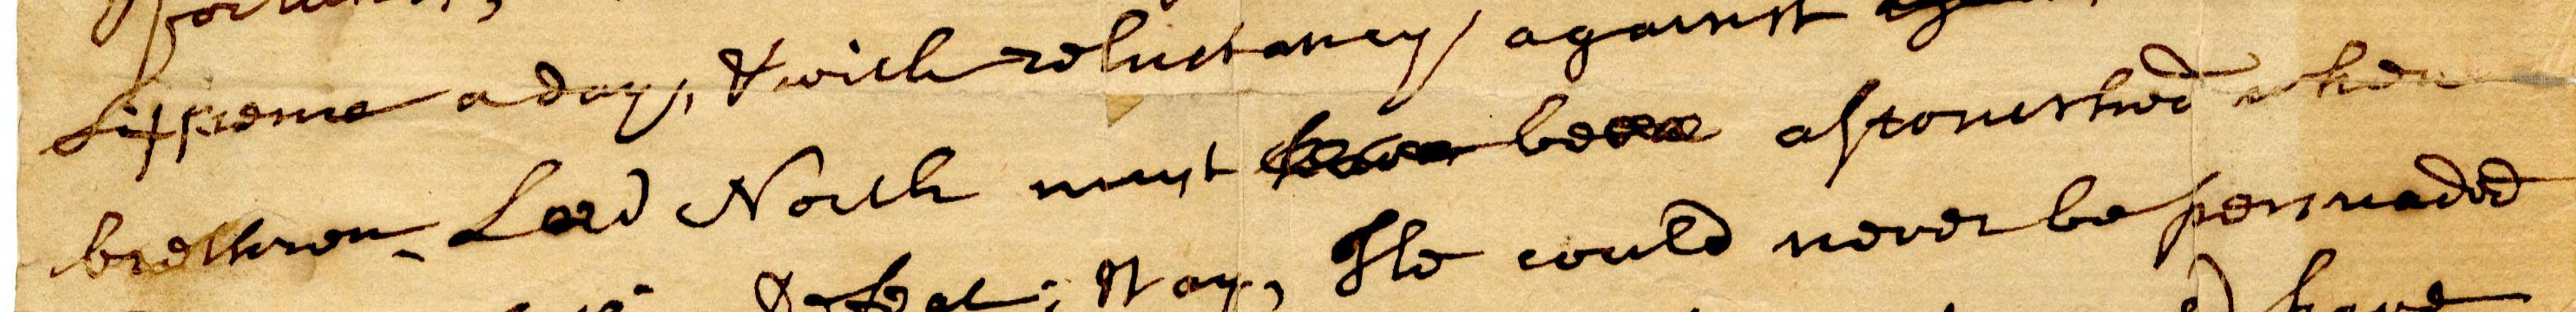brothers. Lord North must [have been] astonished when
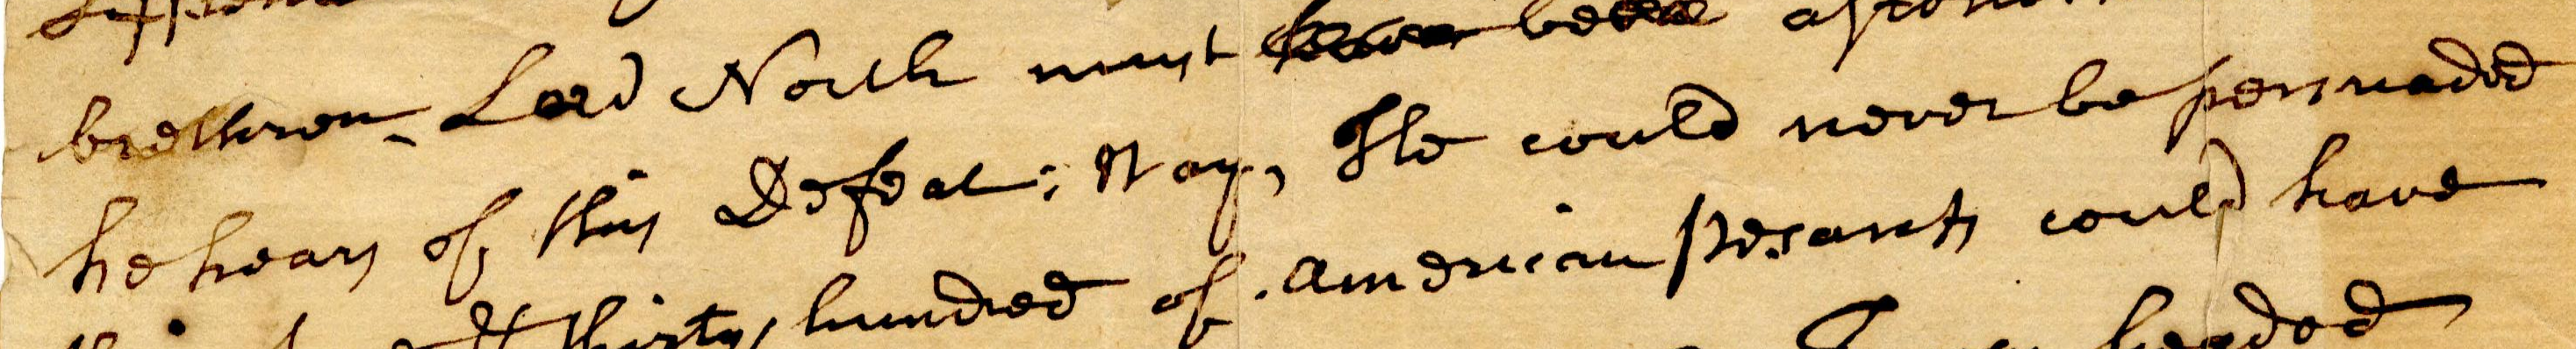he hears of this Defeat; Nay, He could never be persuaded
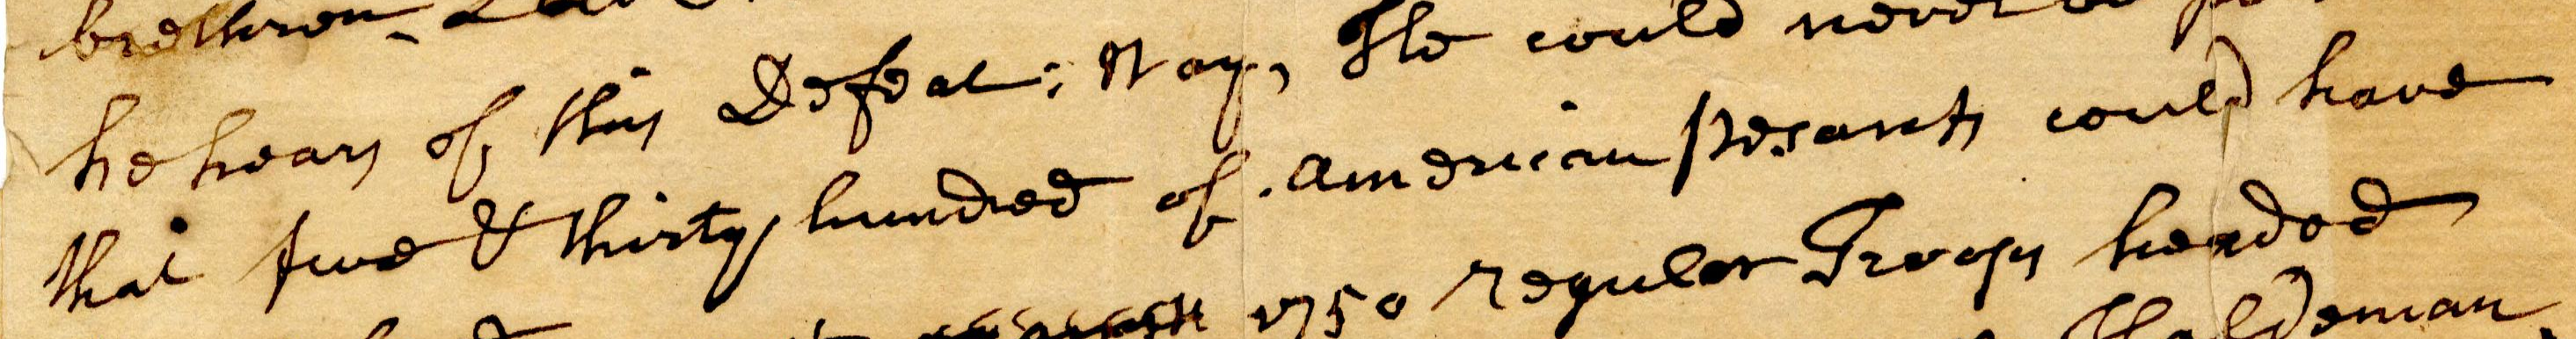that two & thirty hundred of. American pesants could have
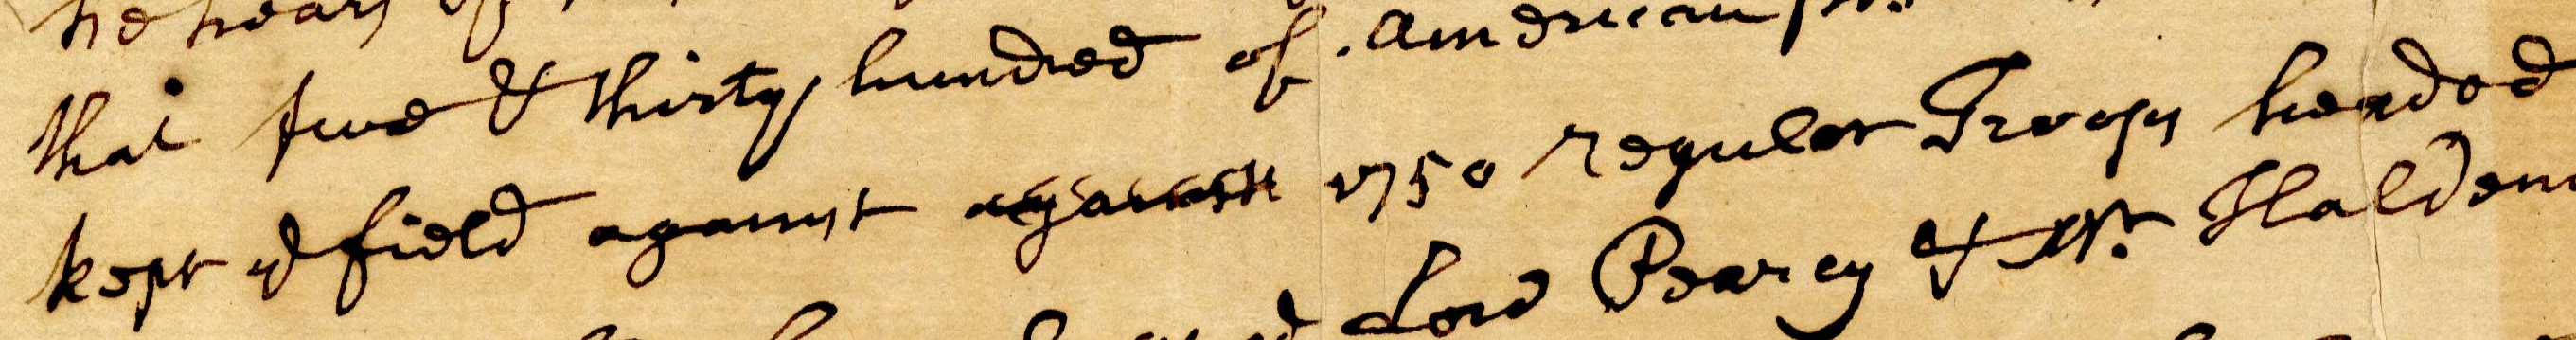kept afield against 750 regular Troops headed
